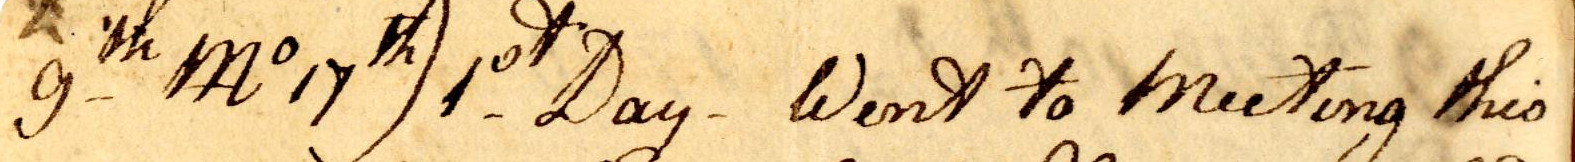9^th M^o 17^th) 1^st Day- Went to Meeting this
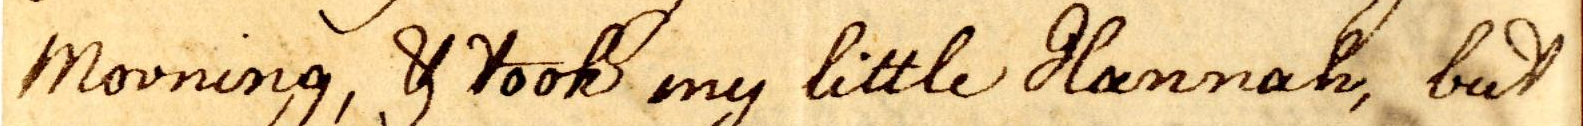Morning, & took my little Hannah, but
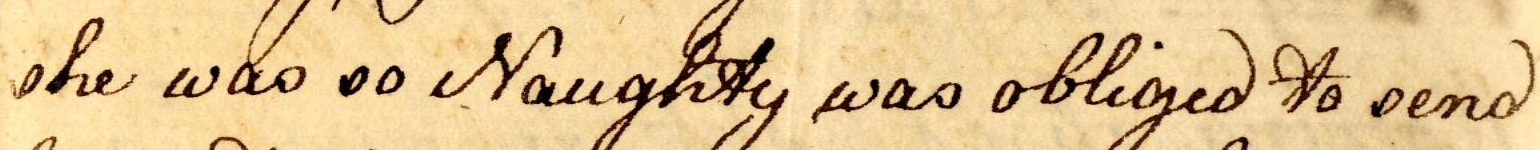she was so Naughty was obliged to send
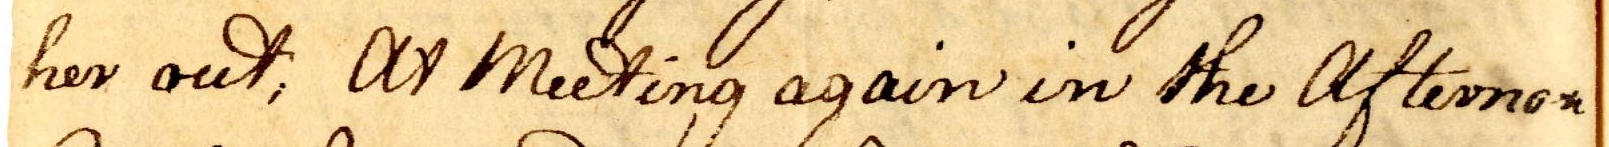her out, At Meeting again in the Afternon
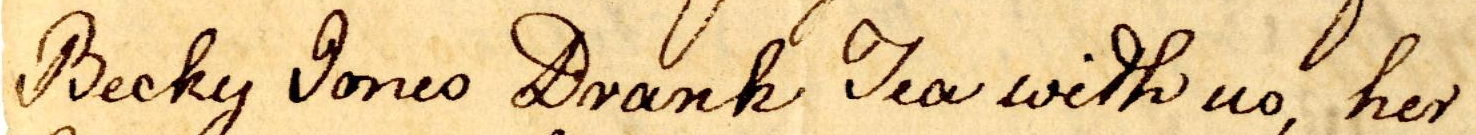Becky Jones Drank Tea with us, her
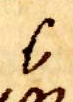I
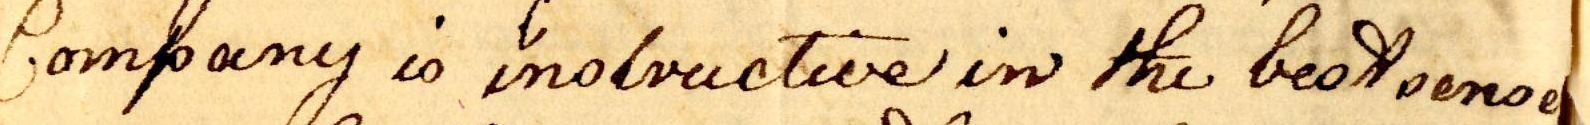Company is instructive in the best sense
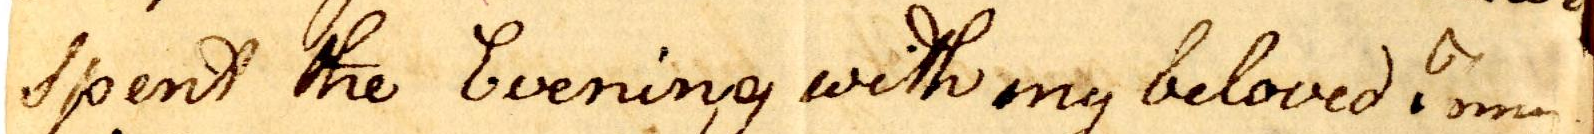spent the Evening with my beloved Tomy
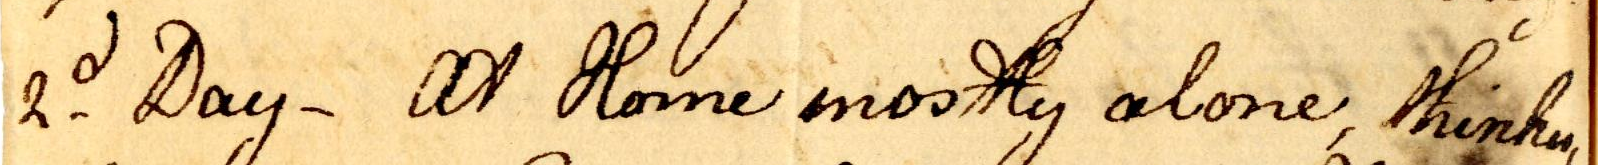2^d Day- At Home mostly alone, thinking
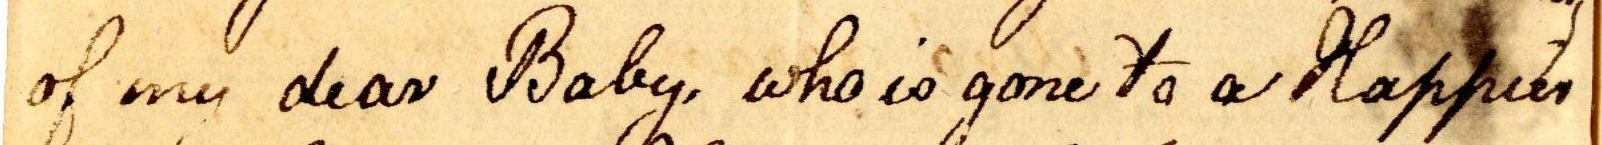of my dear Baby, who is gone to a Happier
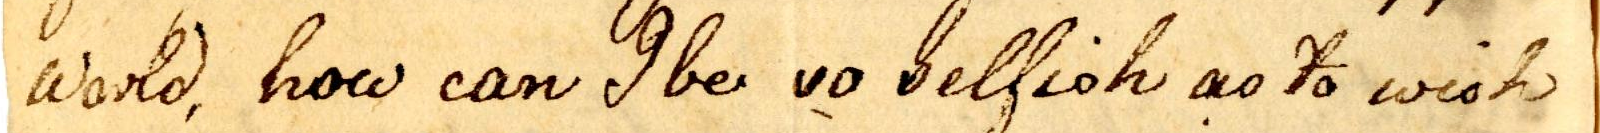World, how can I be so selfish as to wish
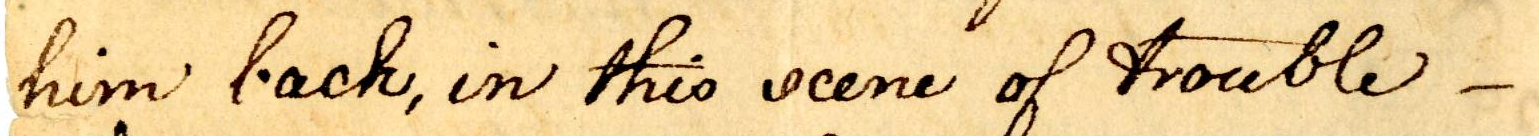him back, in this scene of trouble-
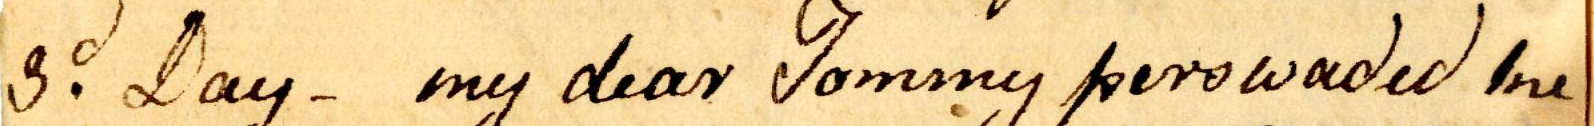3^d Day- my dear Tommy persuaded me
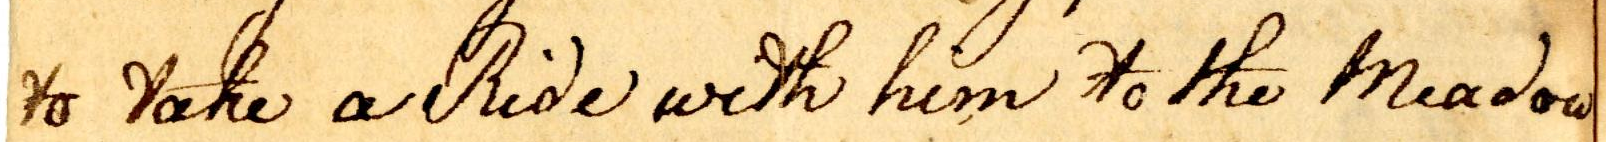to take a Ride with him to the Meadow
